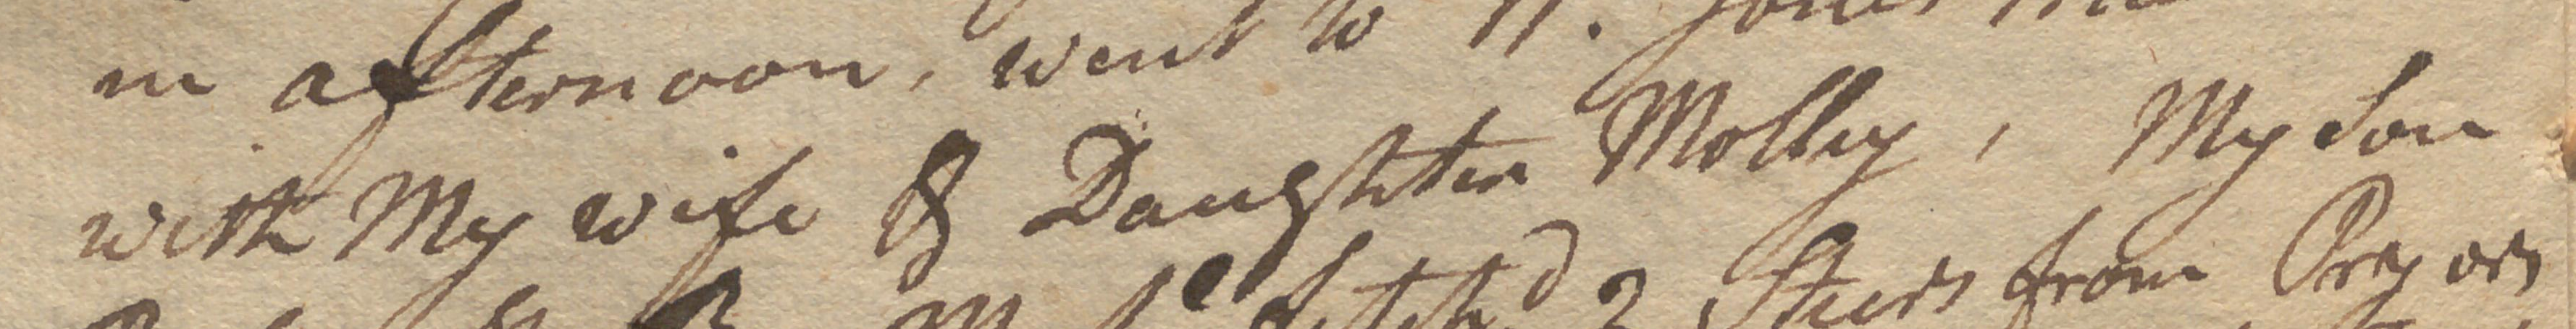with My wife & Daughter Molley, My Son
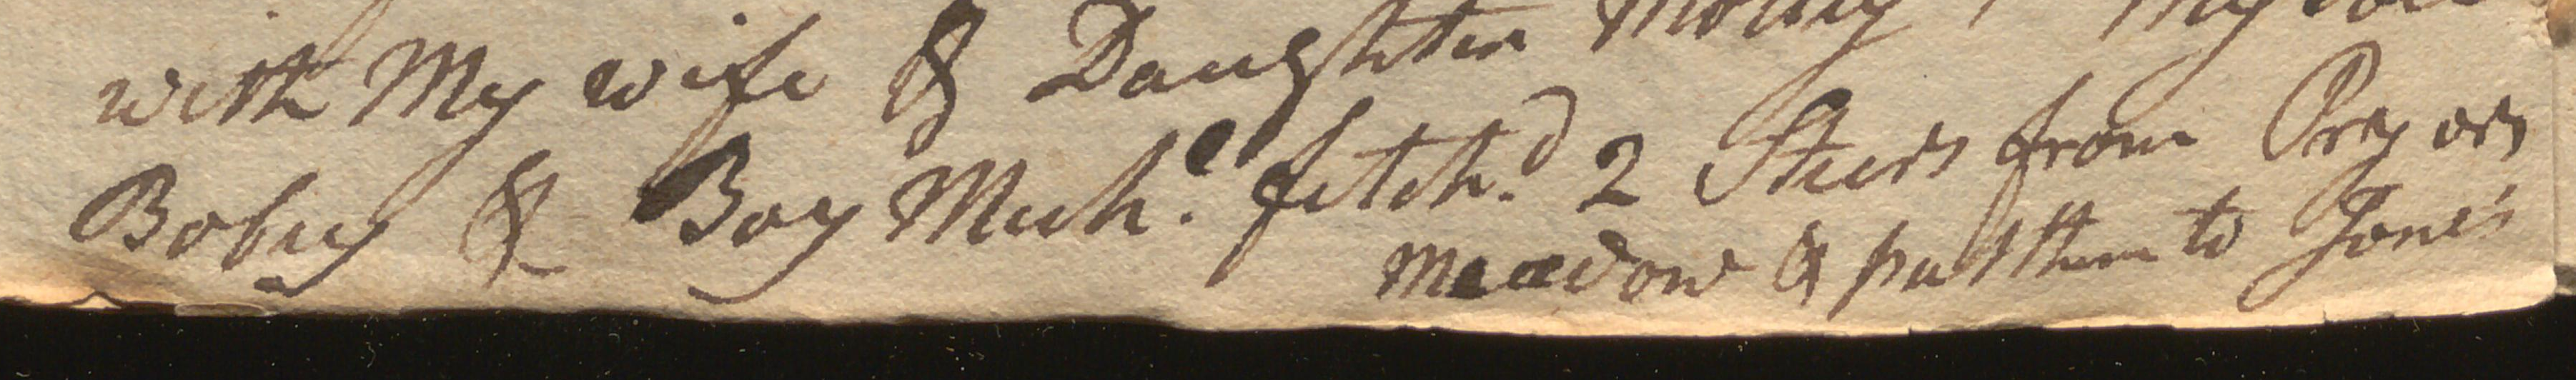Bobe & Boy Mich^l. fetch^d. 2 steers from Pryors
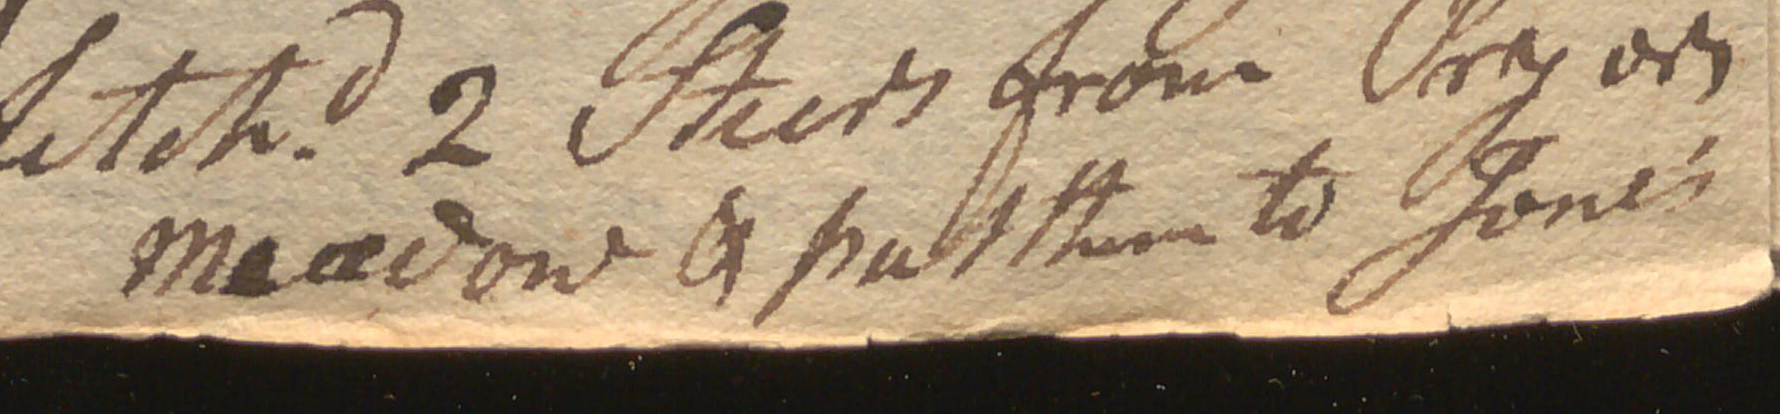Meadow & put them to Jone's
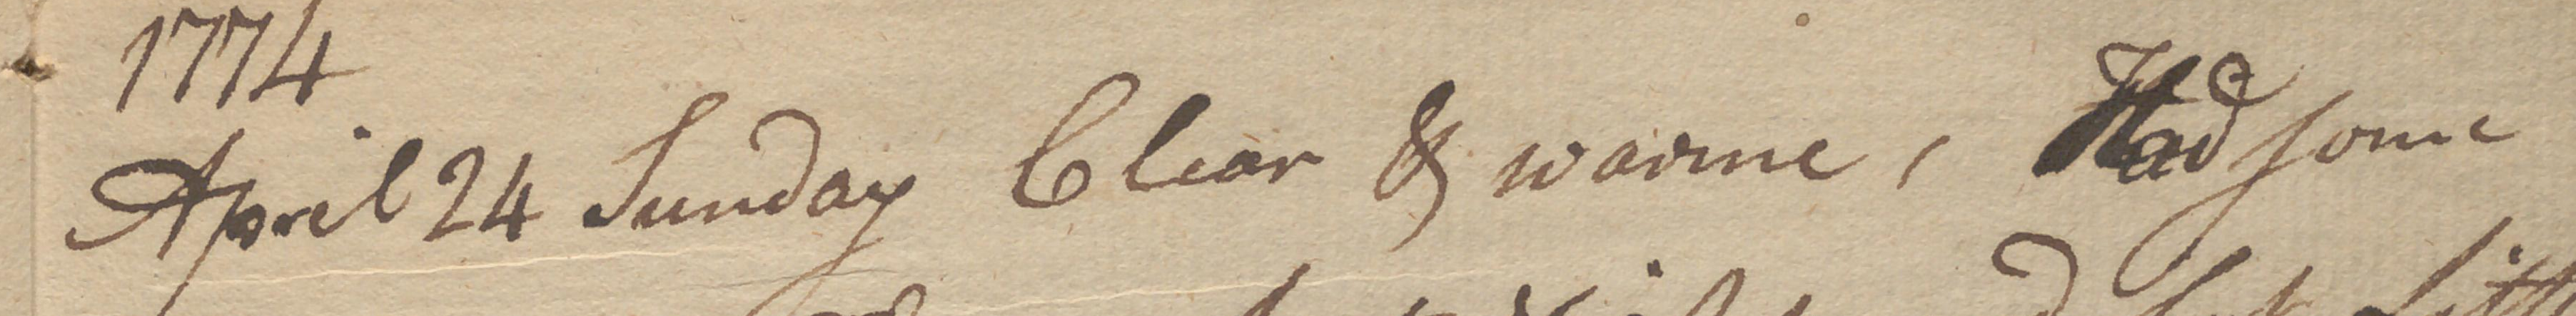April 24 Sunday Clear & warme, Had some
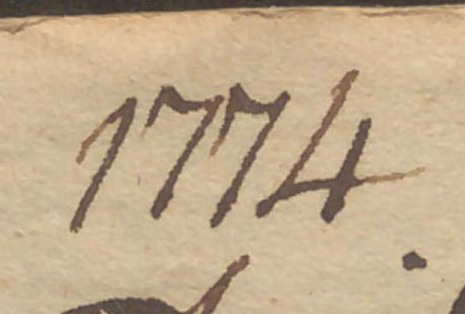1774
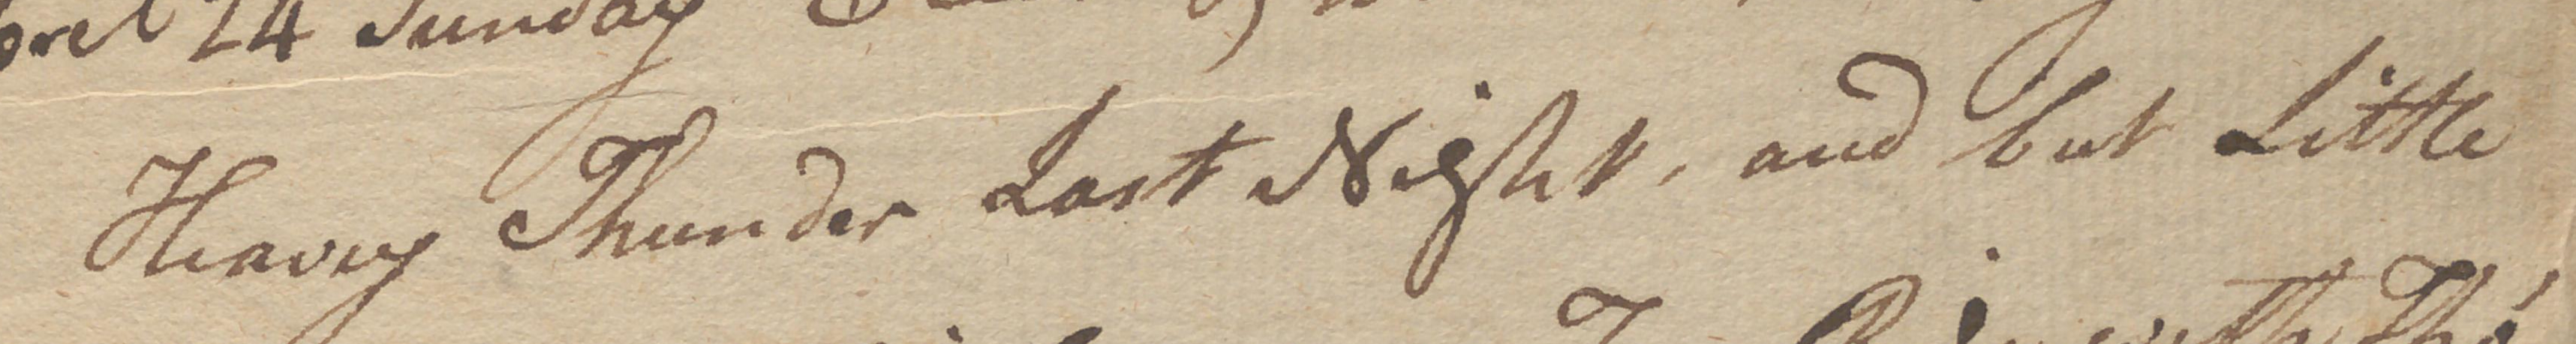Heavey Thunder Last Night, and but Little
